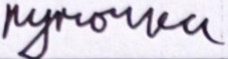пуночка
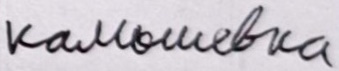камышевка
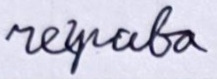чеграва
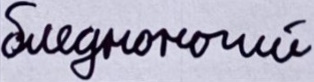бледноногий
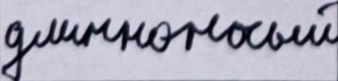длинноносый
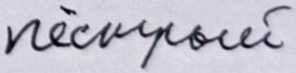пёстрый
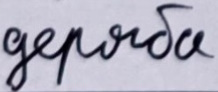деряба
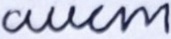аист
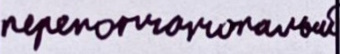перепончатопалый
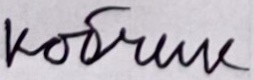кобчик
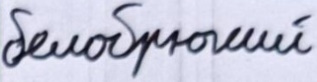белобрюхий
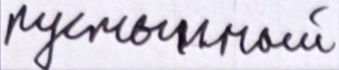пустынный
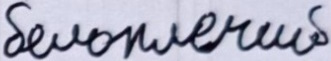белоплечий
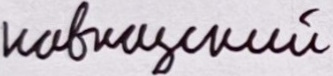кавказский
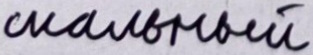скальный
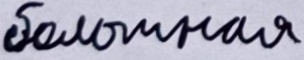болотная
